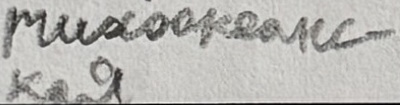тихоокеанс-кая
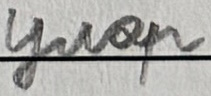улар
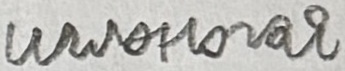иглоногая
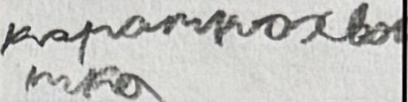караткохвостка
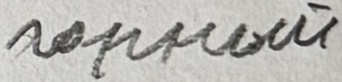гонный
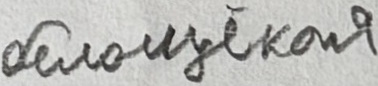белощёкая
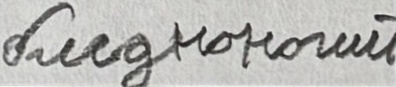бледноногий
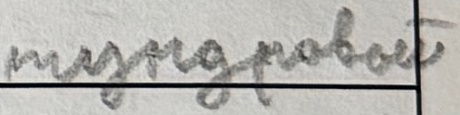тундровый
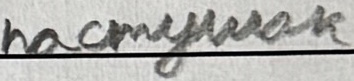пастушок
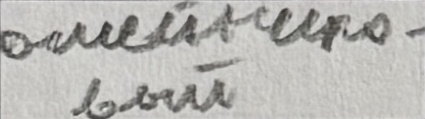ошейнико-вый
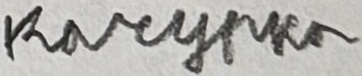качурка
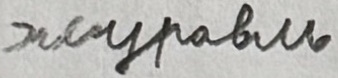журавль
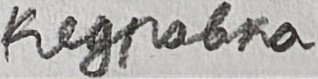кедровка
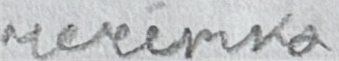чечётка
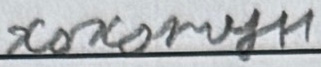хохотун
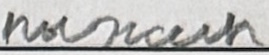пыжик
